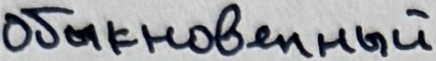обыкновенный
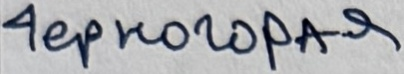черногорая
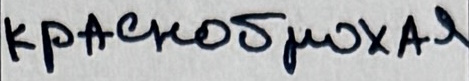краснобрюхая
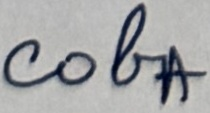сова
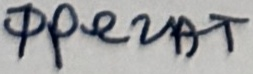фрегат
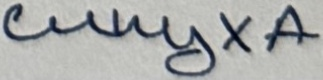сипуха
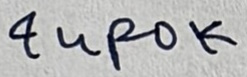чирок
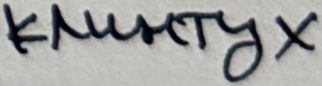клинтух
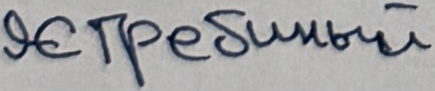ястребиный
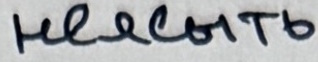неясыть
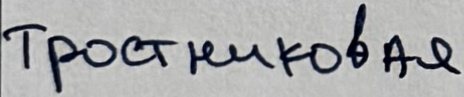тростниковая
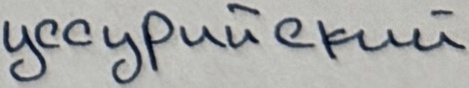уссурийский
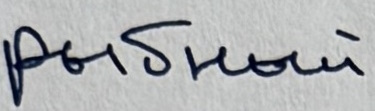рыбный
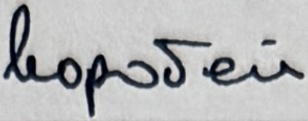воробей
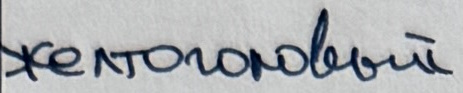желтоголовый
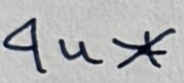чиж
